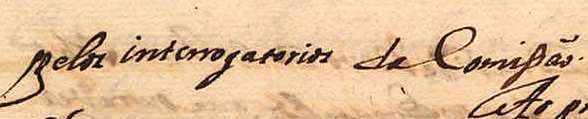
peloz interrogatorios da Comissão.
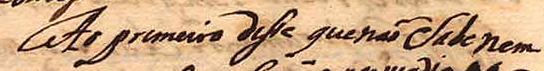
Ao primeiro disse que naõ Sabe nem
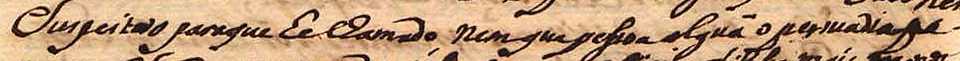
Suspeita o para que he chamado, nem que pessoa alguā o persuadia pa
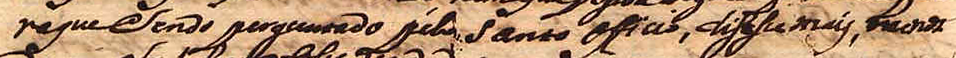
ra que Sendo perguntado pelo Santo officio, disesse mais, menoz
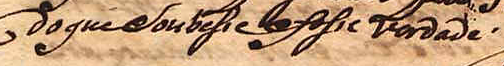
do que Soubesse e fosse verdade.
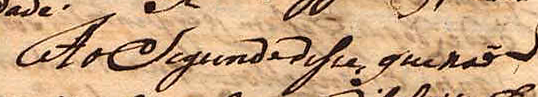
Ao Segundo disse que naõ
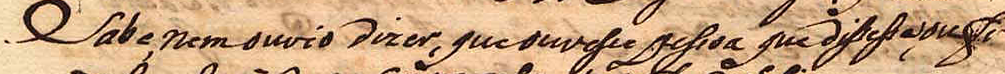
Sabe, nem ouvio dizer, que ouvesse pessoa que dissesse, ou fi
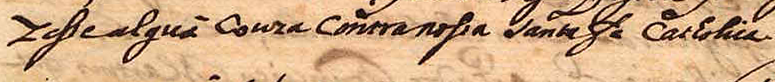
Zesse alguā couza contra nossa santa fe catholica.
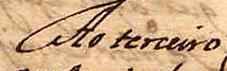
Ao terceiro
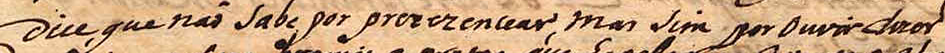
dice, que naõ sabe por prezezencear, mas sim por ouvir dizer
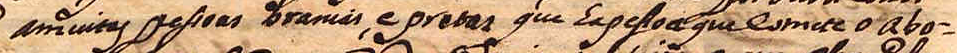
a muitas pessoas brancas, e pretas que ha pessoa que comete o abo
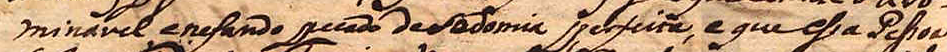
minavel, e nefando pecado de sodomia perfeita, e que esa Pessoa
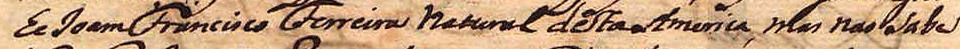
he Ioam Francisco Ferreira natural desta America, mas naõ sabe
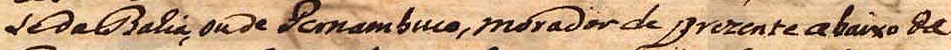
se da Bahia, ou de Pernambuco, morador de prezente abaixo da
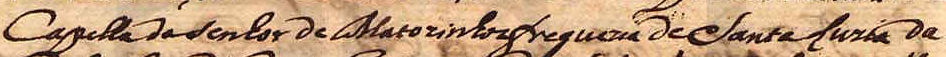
Capella da Senhor de Matozinhoz freguezia de Santa Luzia da
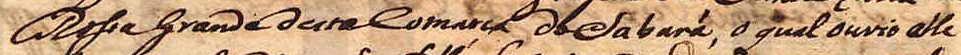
Rossa Grande desta Comarca do Sabará, o qual ouvio elle
